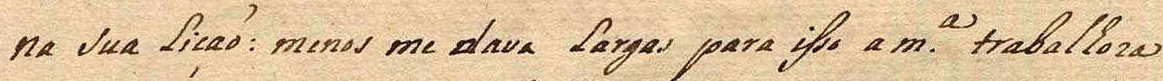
na sua Liçaõ: menos me dava Largas para isso a m.a trabalhoza
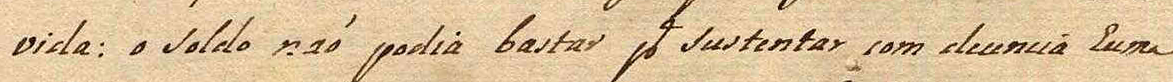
vida: o Soldo naõ podia bastar p̄ sustentar com decencia huma
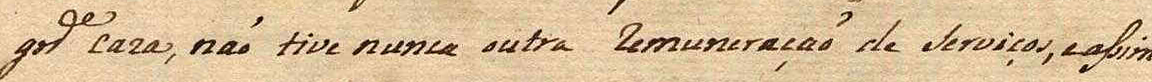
gr.de caza, naõ tive nunca outra Remuneraçaõ de Serviços, e assim
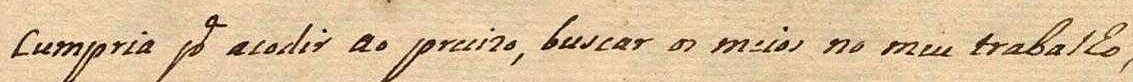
Cumpria p.a acodir ao precizo, buscar os meios no meu trabalho,
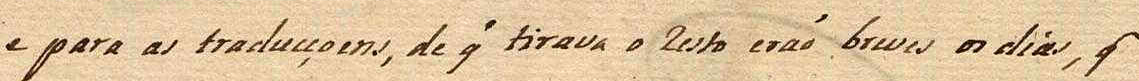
e para as traducçoens, de q̄ tirava o Resto eraõ breves os dias, q̄
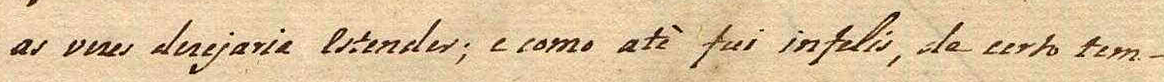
as vezes dezejaria estender, e como até fui infelis, de certo tem
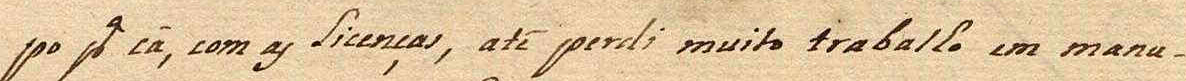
po pa cá, com as Licenças, até perdi muito trabalho em manu
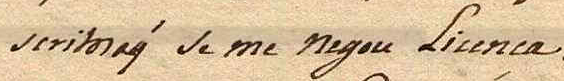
scritos a q̄ se me negou Licença.
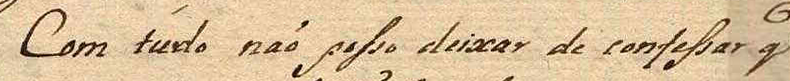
Com tudo naõ posso deixar de confessar q̄
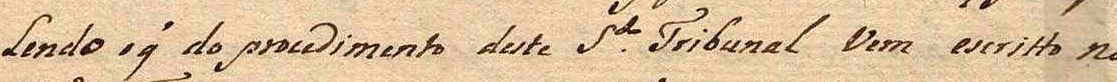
lendo o q̄ do procedimento deste S.to Tribunal Vem escritto no
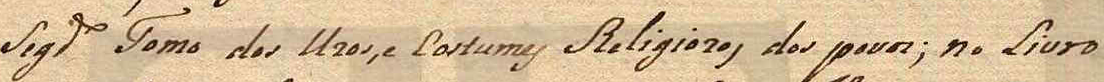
segd.o Tomo dos Uzos, e Costumes Religiozos dos povos; no Livro
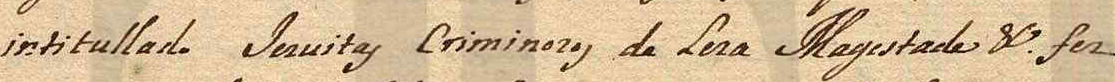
intitullado Iezuitas Criminozos de Leza Magestade &.a fez
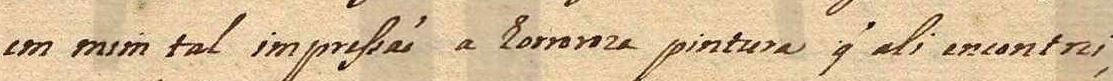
em mim tal impressaõ a horroroza pintura q̄ ali encontrei,
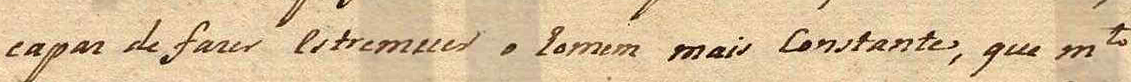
capaz de fazer estremecer o homem mais constante, que m.to
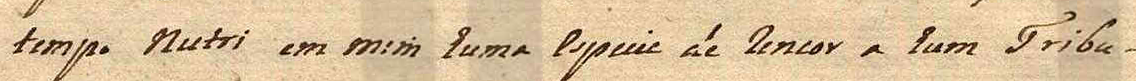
tempo nutri em mim huma especie de Rancor a hum Tribu
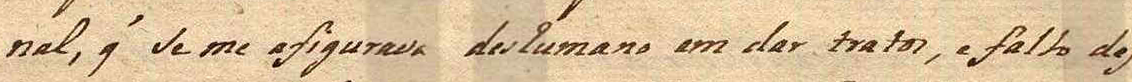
nal, q̄ se me afigurava deshumano em dar tratos, e falto das
